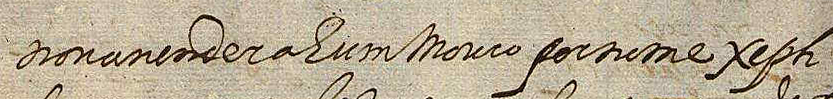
nou a uender a hum Mouro por nome Xeph
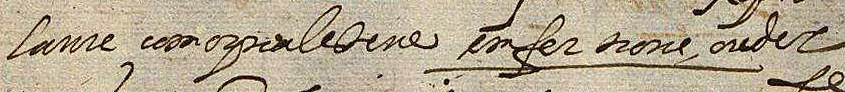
laure com o qual esteue em fez noue, ou dez
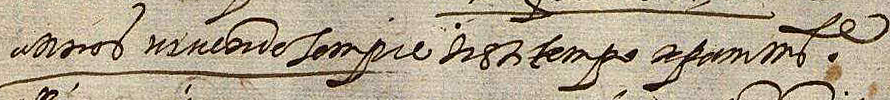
annos uiuendo sempre neste tempo xpamm.te
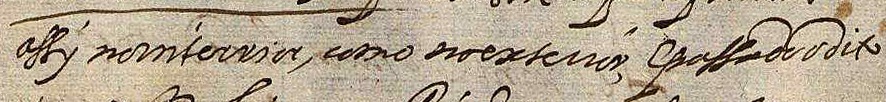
assy no interior, como no exterior, E passado o dito
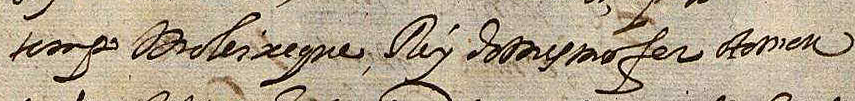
tempo Molei xeque, Rey do mesmo fez o tomou
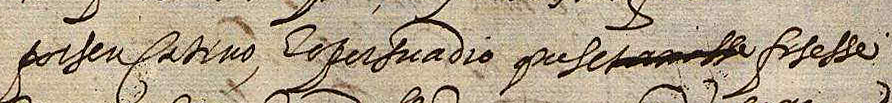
por seu Catiuo, E o persuadio que se tornasse fisesse
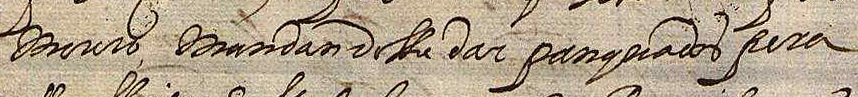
mouro, mandandolhe dar panquados pera
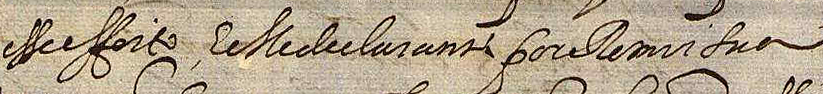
esse effeito, E elle declarante por Remir sua
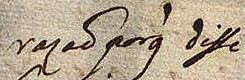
razaõ por q̄ disse
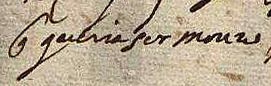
q̄ queria ser mouro
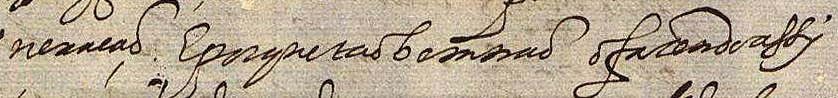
uexaçaõ. E porque taõbem naõ o fazendo assy
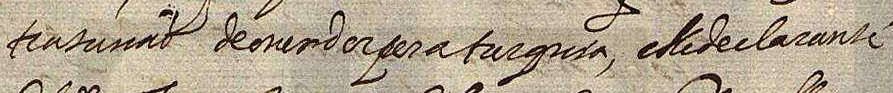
tratauaõ de o uender pera turquia, elle declarante
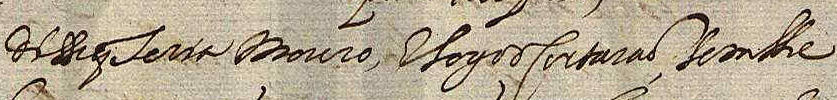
disse q̄ seria mouro, E logo o Cortaraõ, sem lhe
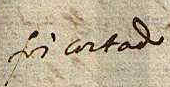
foi cortado
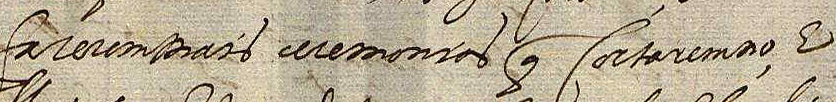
fazerem mais ceremonias q̄ Cortaremno, E
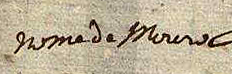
nome de Mouro
